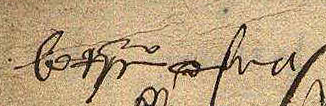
botycro e sua /
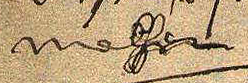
molher
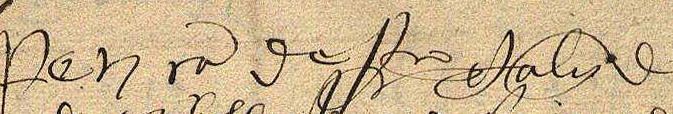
Petjçā de frco Galȳdo
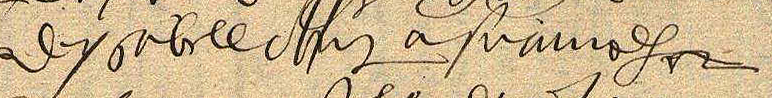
de ysabell Anta sua molher
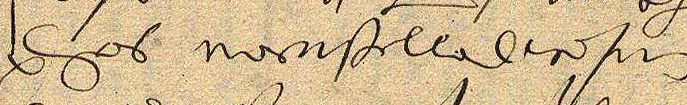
p̄sos na castello de coJm
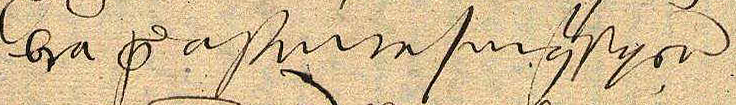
bra p̄o a santa Jmqisyçā
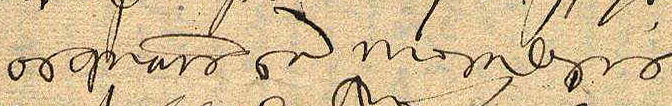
os quaes sā moradores
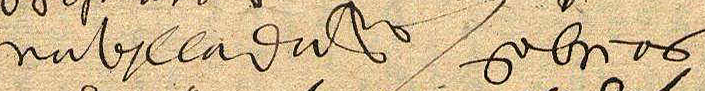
na vylla davro / sobre os
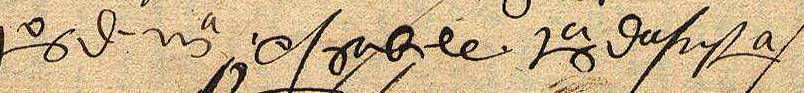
tos de ma e Jsabell tas da Justa
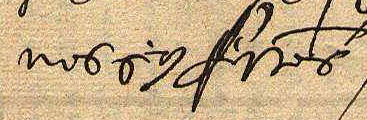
nos seꝯ feitos
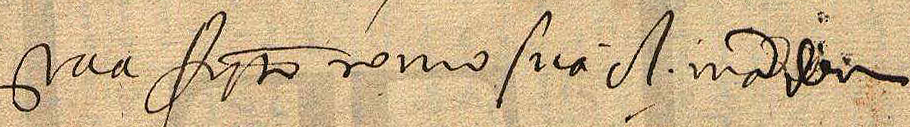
sera fejto como sua .A. mādou
